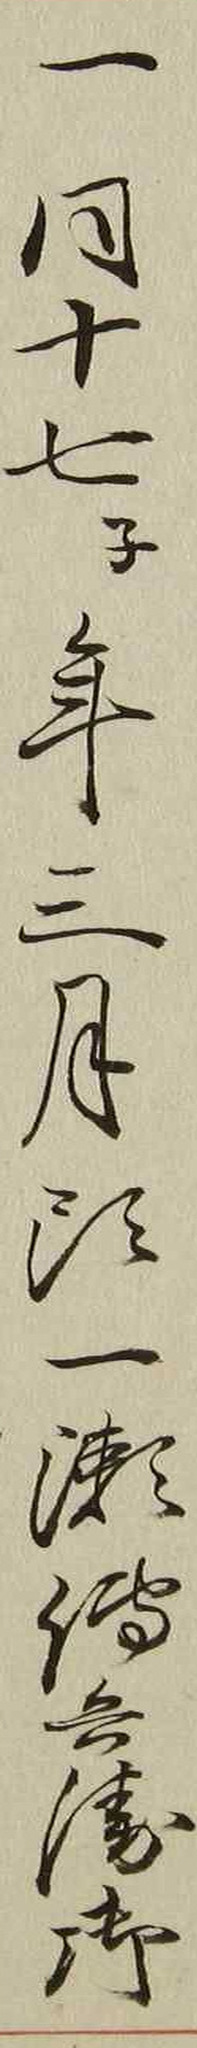一同十七子年三月頭一瀬伝兵衛御
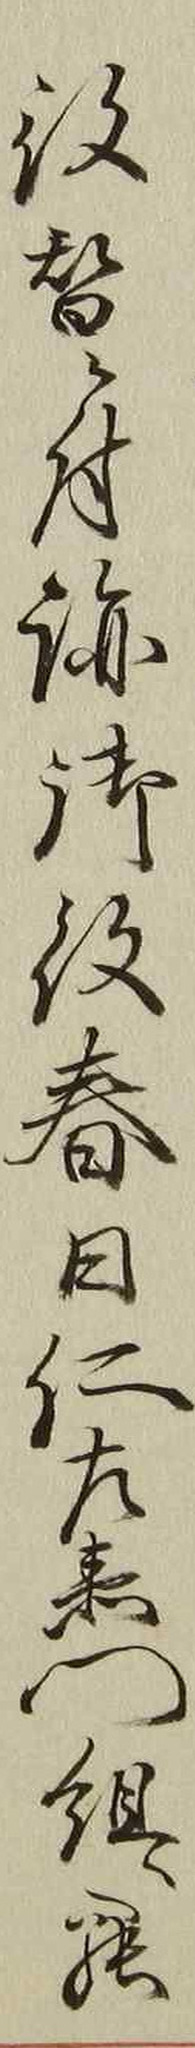役替ニ付跡御役春日仁左衛門組ニ罷
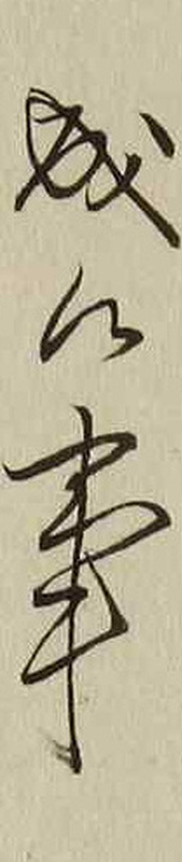成候事
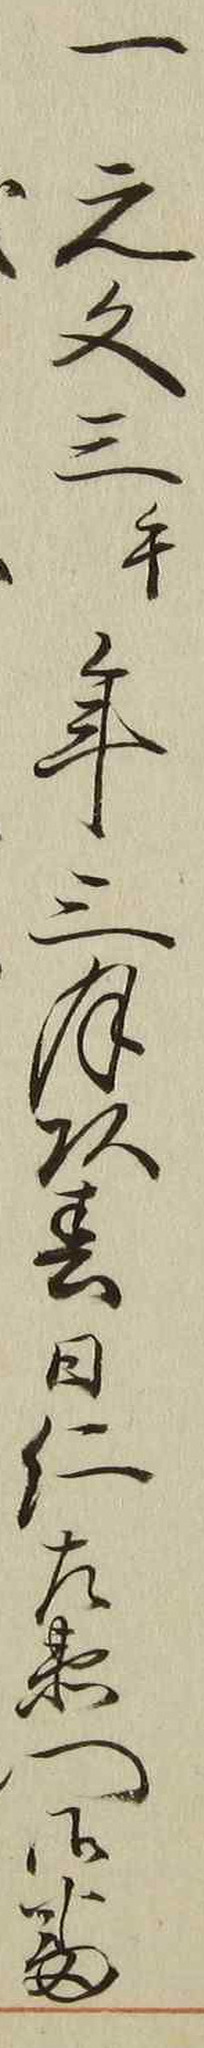一元文三午年三月頭春日仁左衛門御番
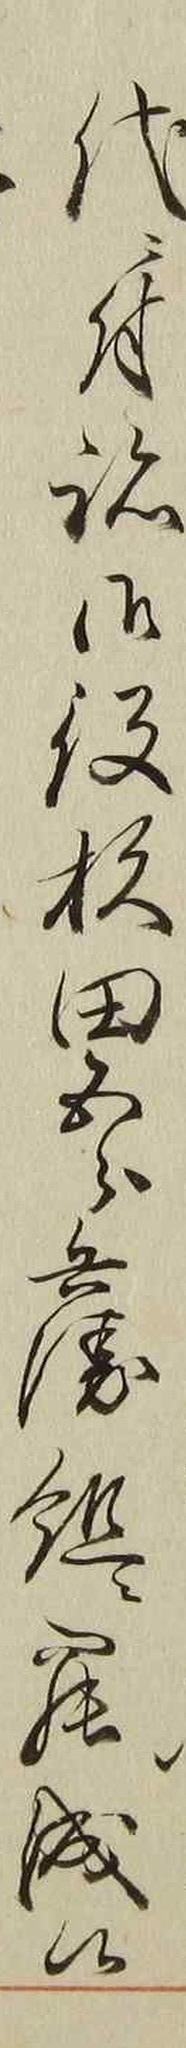代ニ付跡御役杦田五郎兵衛組ニ罷成候事
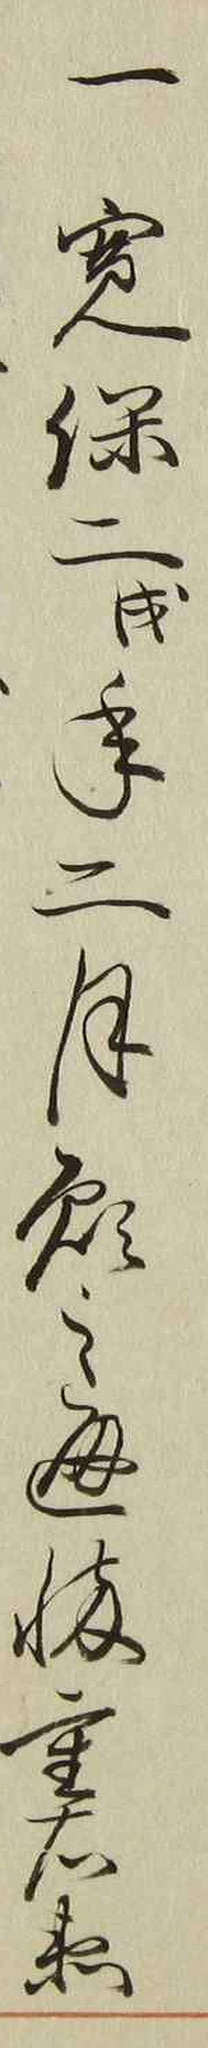一寛保二戌年二月願之通忰重右衛
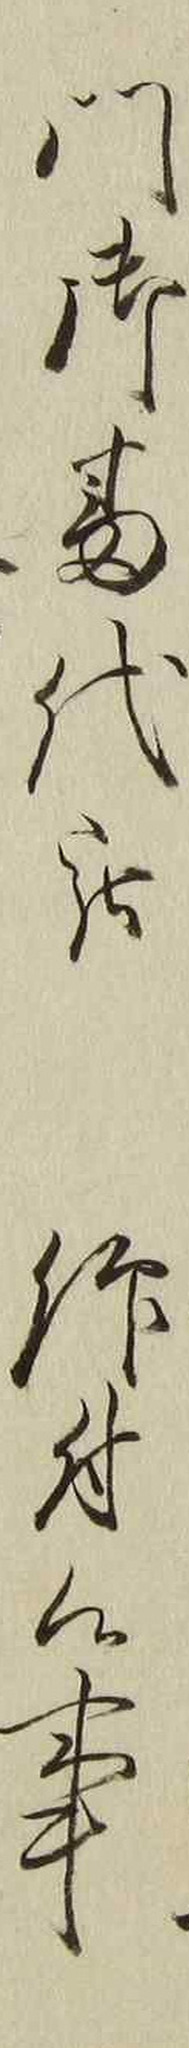門御番代被仰付候事
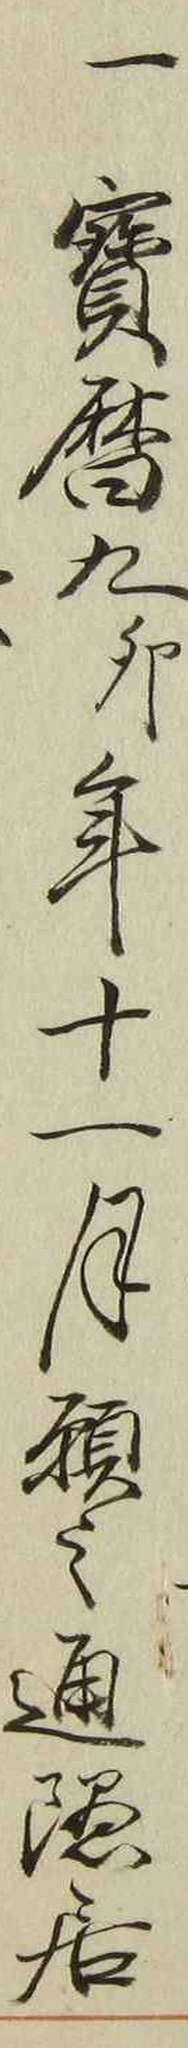一宝暦九卯年十一月願之通隠居
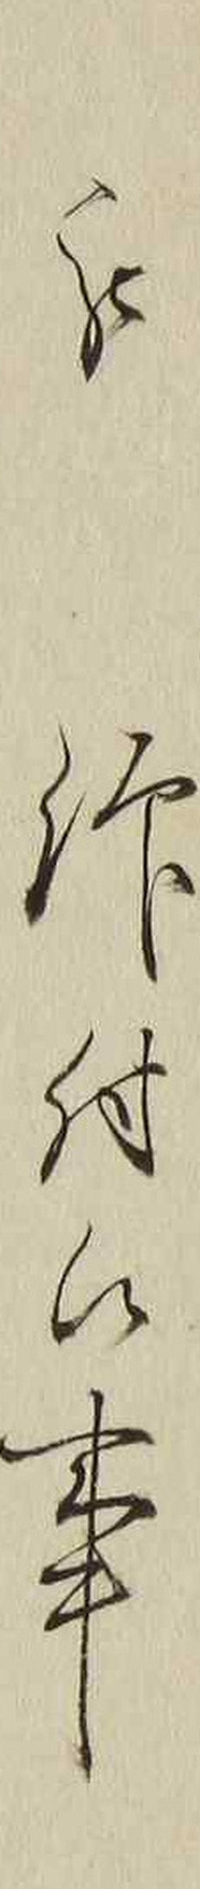被仰付候事
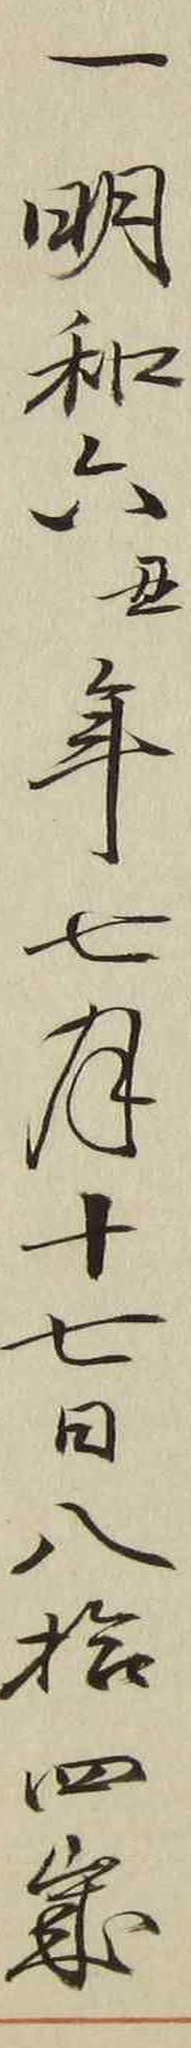一明和六丑七月十七日八拾四歳
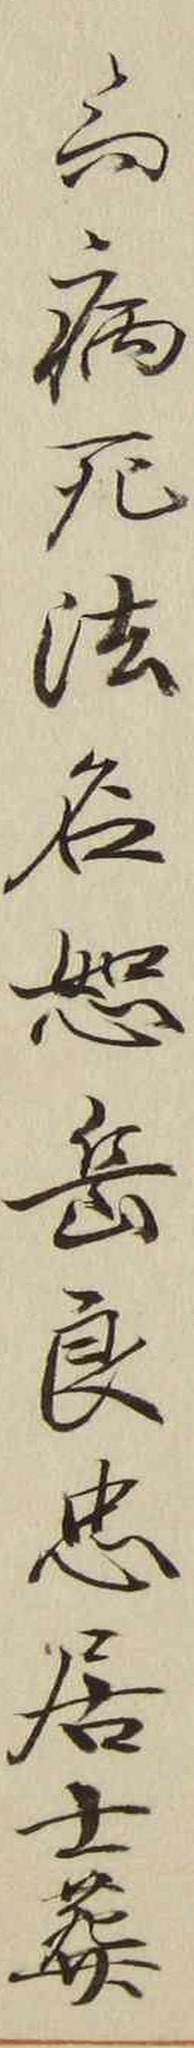ニ而病死法名恕岳良忠居士葬

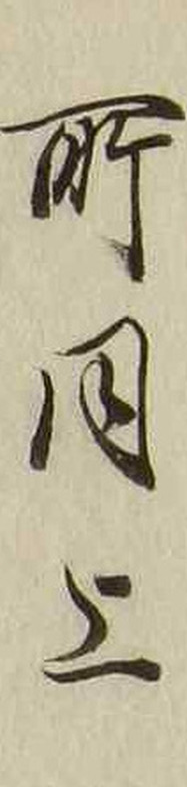所同上
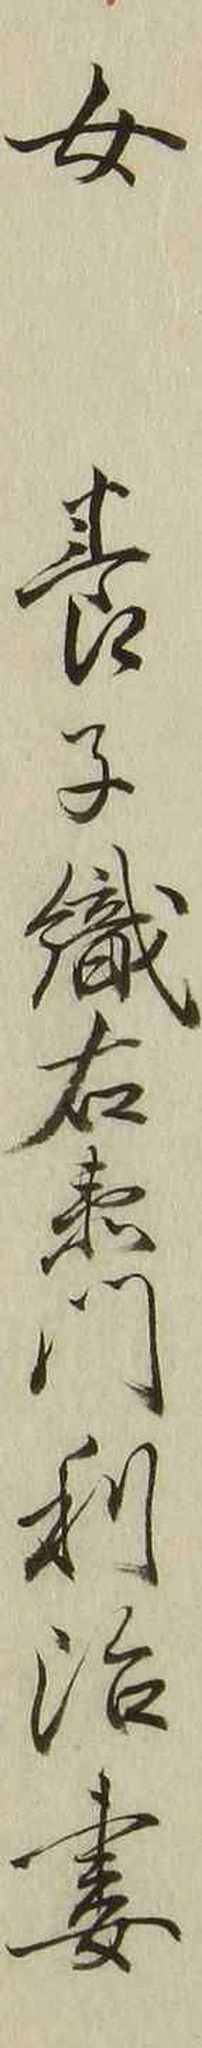女養子織右衛門利治妻
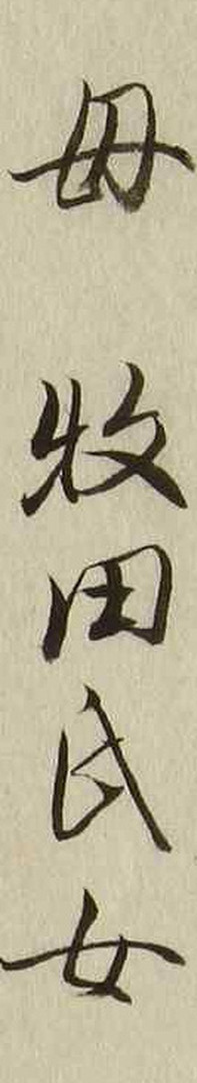母牧田氏女
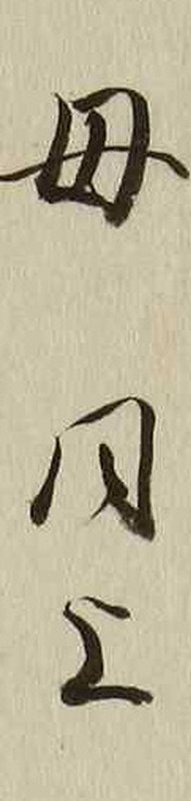母同上
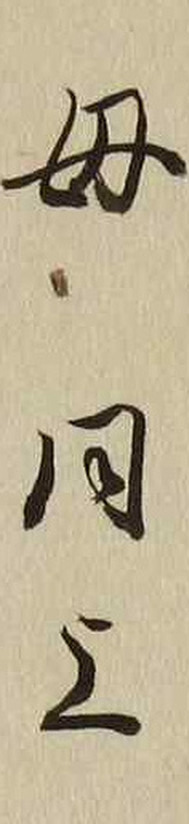母同上
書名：諸士系譜　巻之54　ほ之部1
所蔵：会津若松市立会津図書館
